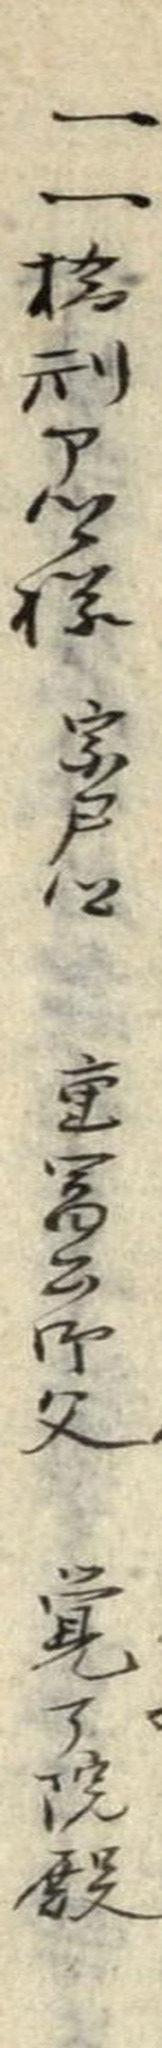一一橋刑部卿様宗尹卿重冨公御父覚了院殿

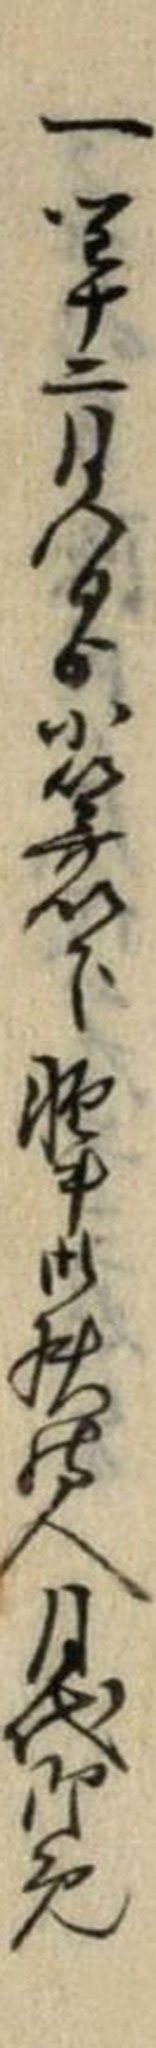一閏十二月八日ゟ小算以下軽キ御扶持人月代御免
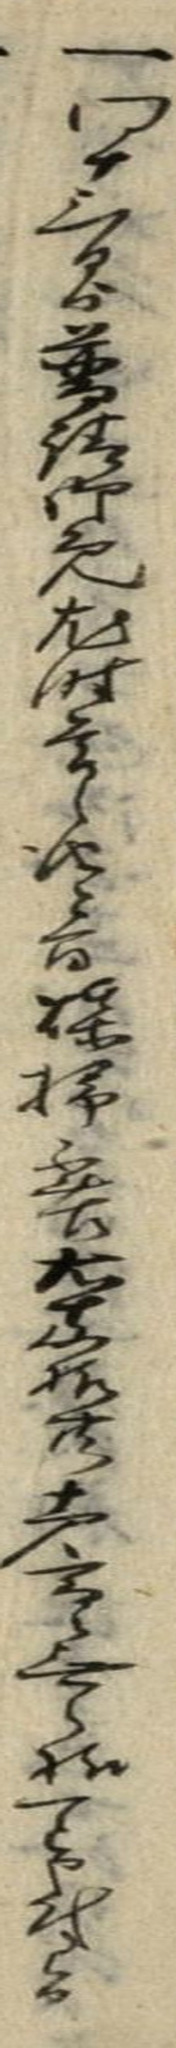一同十三日ゟ普請御免尤時節之儀に候間煤掃不苦右両様共声高に無之様可被申付旨
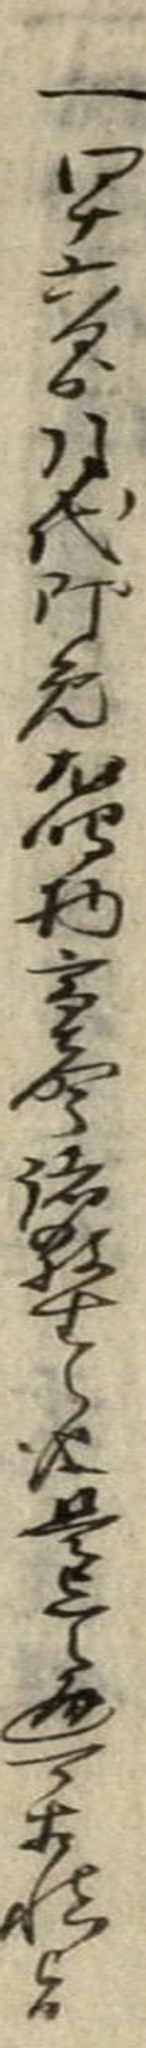一同十六日ゟ月代御免尤鳴物高声諸殺生之儀是迄之通可相慎旨
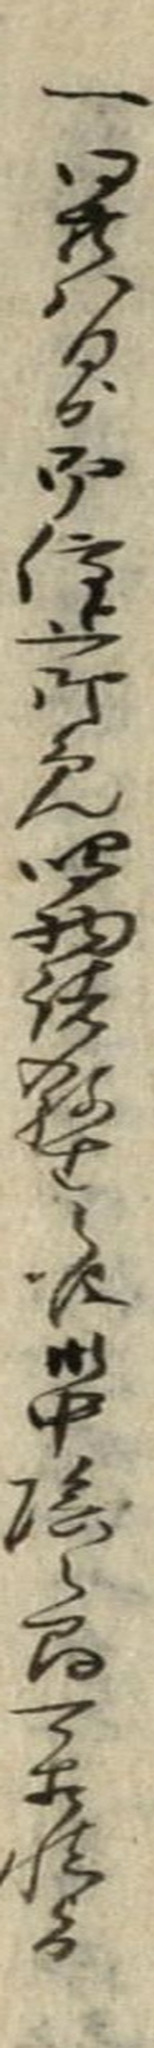一同廿八日ゟ御停止御免鳴物諸殺生之儀御中陰之間可相慎旨
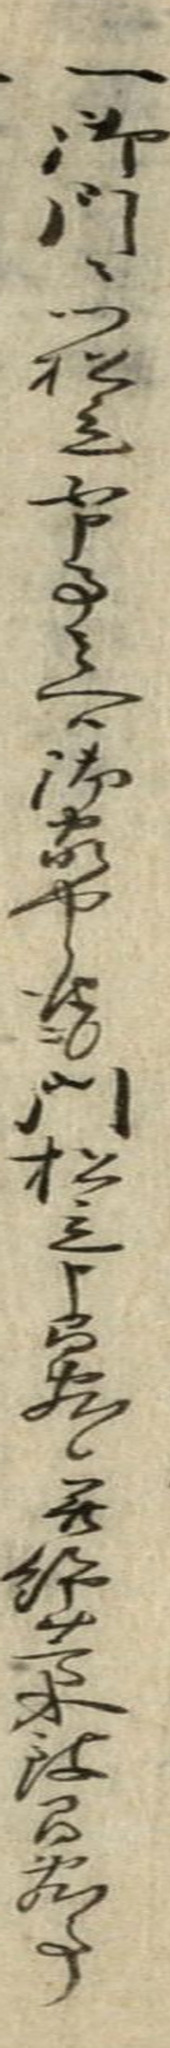一御門に門松立不申事に候へは御家中之儀も門松立申間敷候并飾菊致間敷事
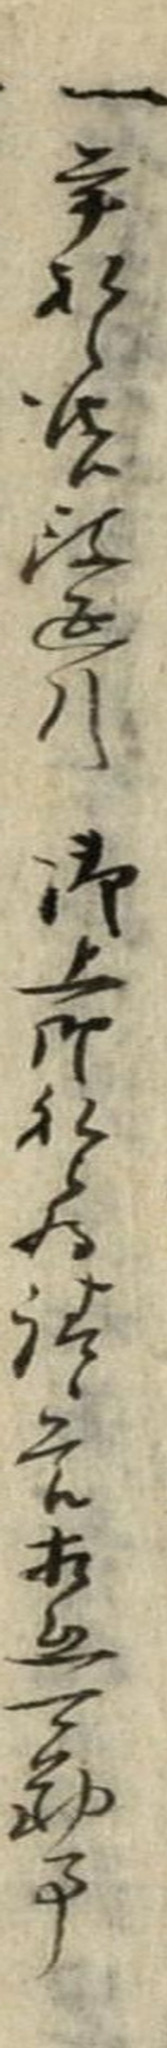一年礼之儀は致延引御上御礼被為請候節相互可勤事
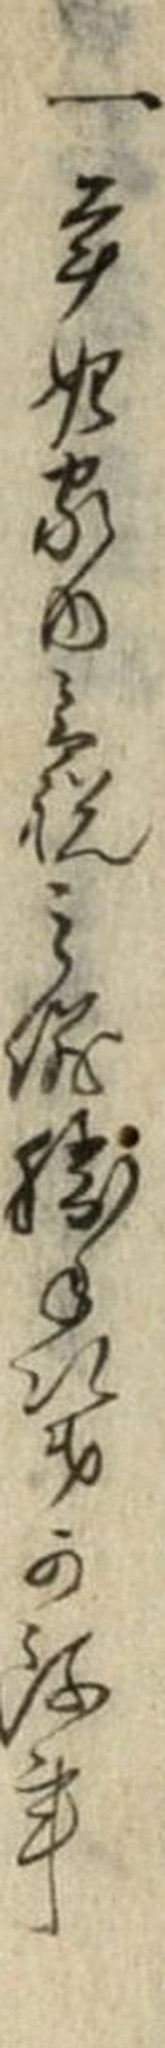一年始家内に而祝之儀勝手次第可致事
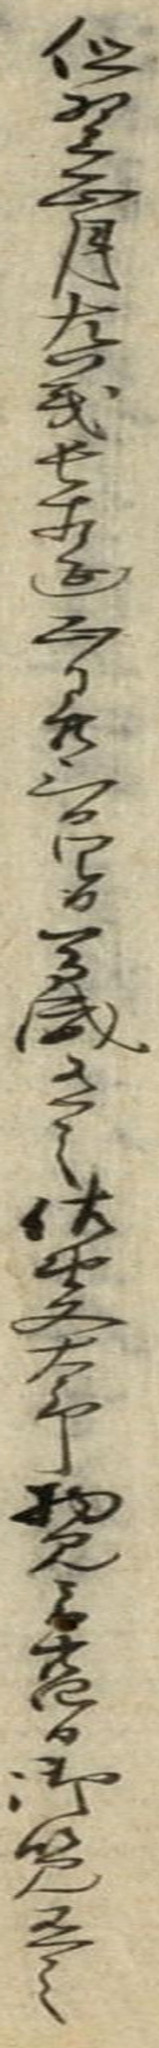但翌正月左義長相延正月廿三日已後万歳有之佐野又太郎物見に而廿四日御覧有之
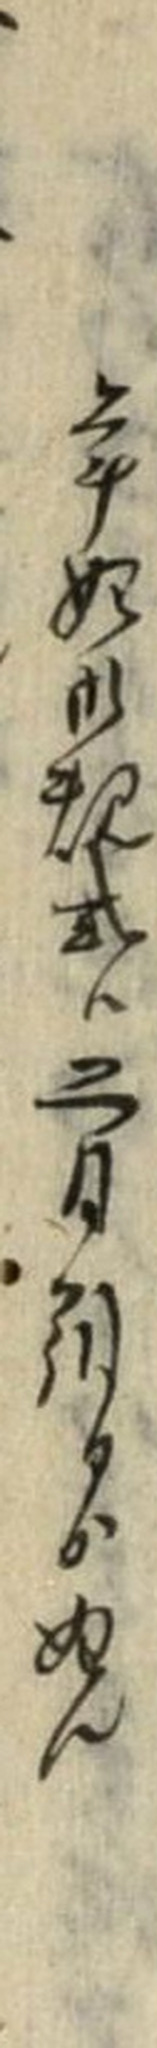年始御規式は二月朔日ゟ始る
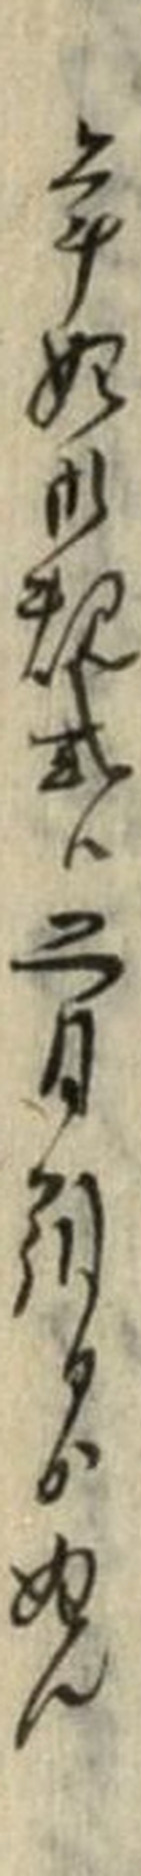年始御規式は二月朔日ゟ始る
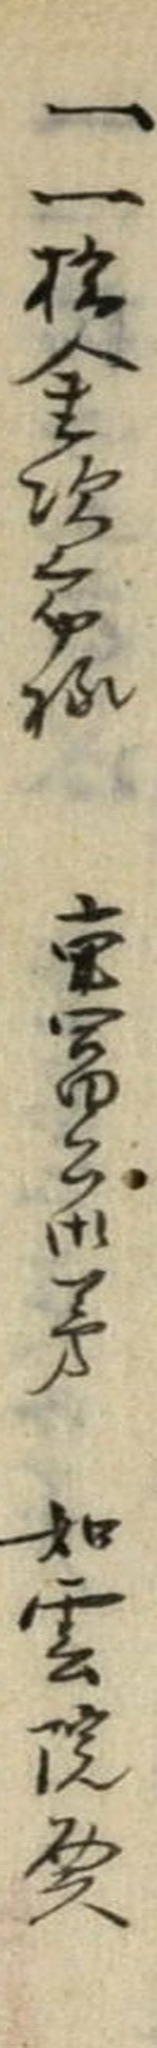一一橋金次郎様重冨公御弟如雲院殿
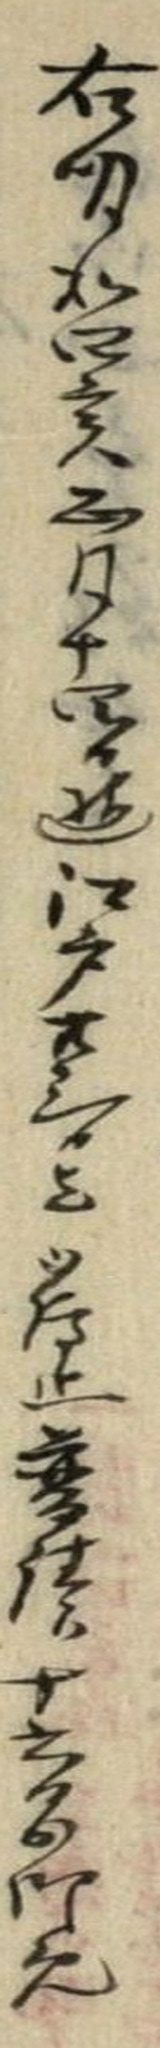右明和四亥正月十四日逝江戸廿三日迄御停止普請十六日ゟ御免
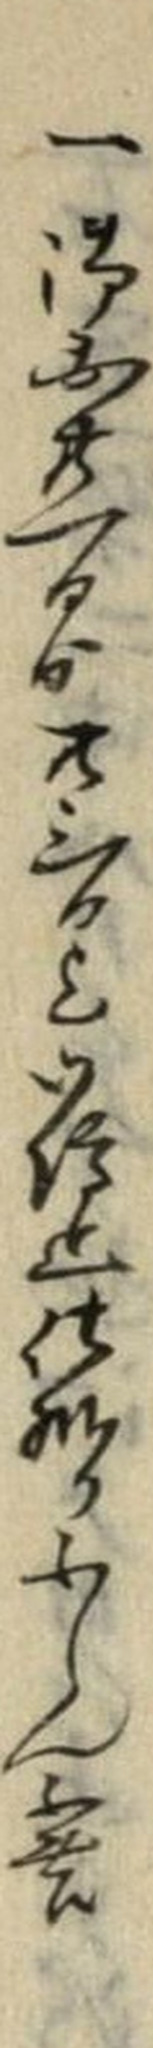一御国廿一日ゟ廿三日迄御停止仕掛りふしん不苦
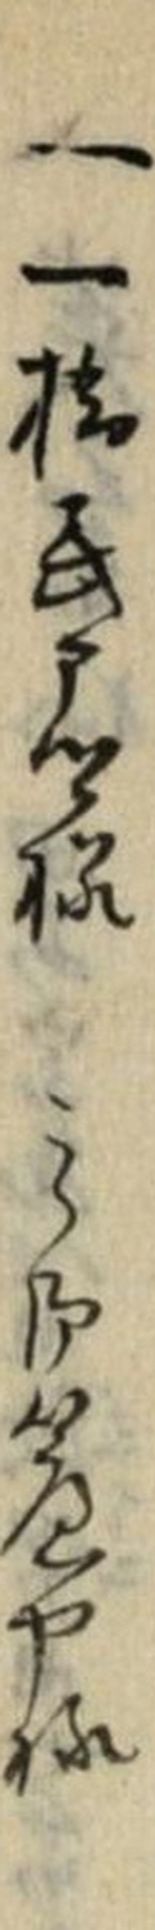一一橋民部卿様之御簾中様
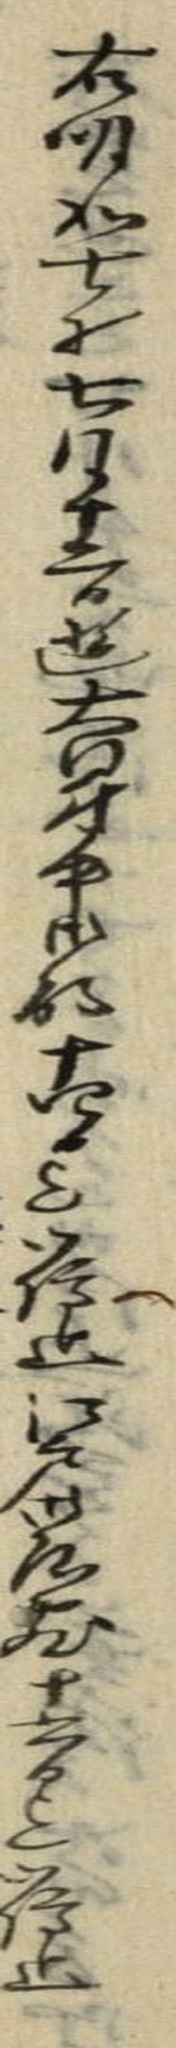右明和七刁七月十二日逝大目付中御触十四日迄御停止江戸御屋敷十六日迄御停止
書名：御停止異変死失
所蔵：福井県文書館 Fukui Prefectural Archives
